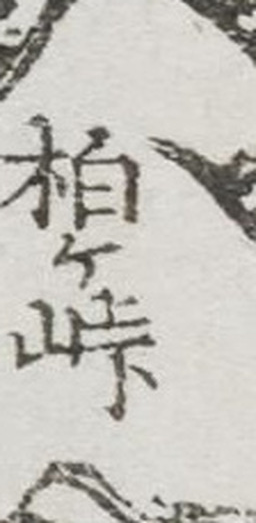柏ヶ峠
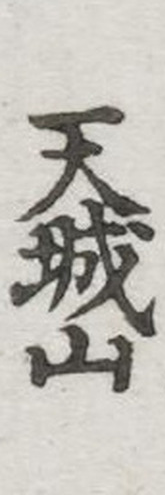天城山

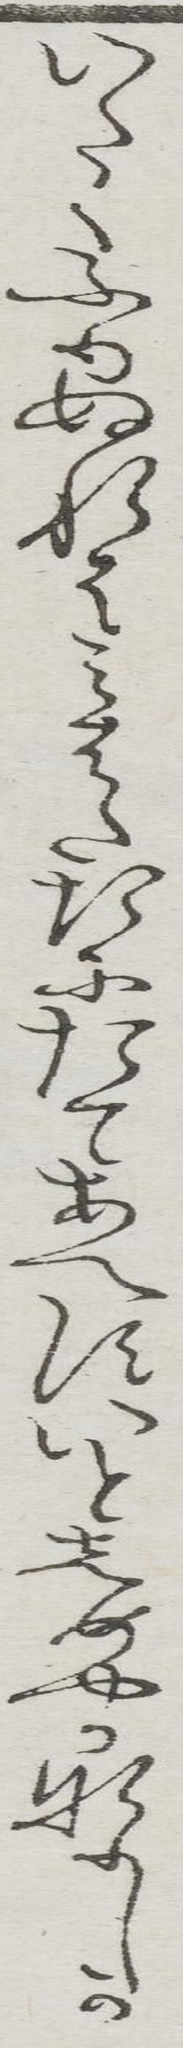いたくふりぬれはみはたたにたてあへすいとしめやかなりにしか
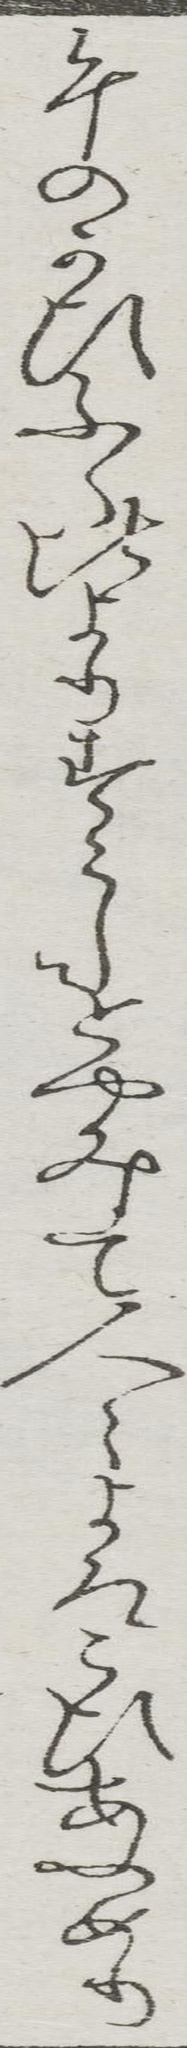午のかひふく頃よりすこしをやみて人々よろこひあふめり
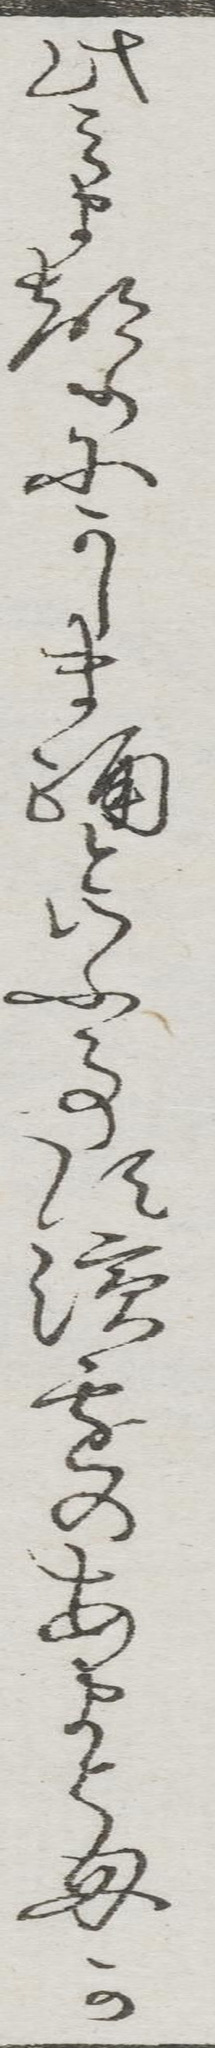此みまつりにかしま踊といふ事す浜辺のあまともか
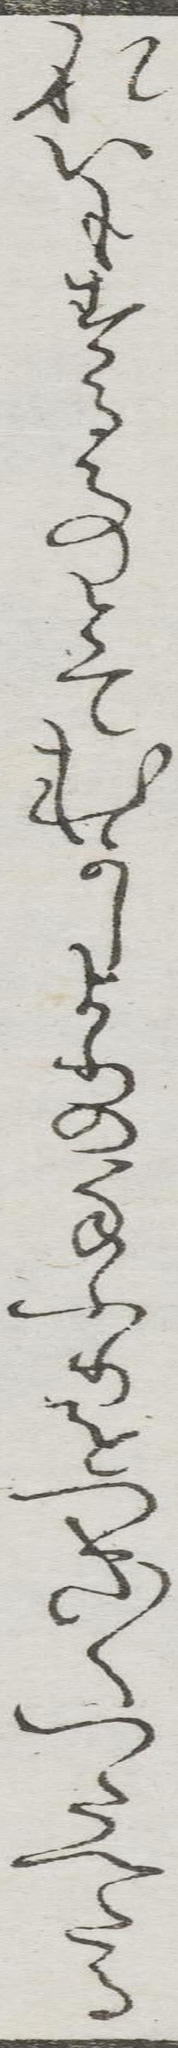れいもする事とてむかしよりの手ふりをつき〳〵つたへたる
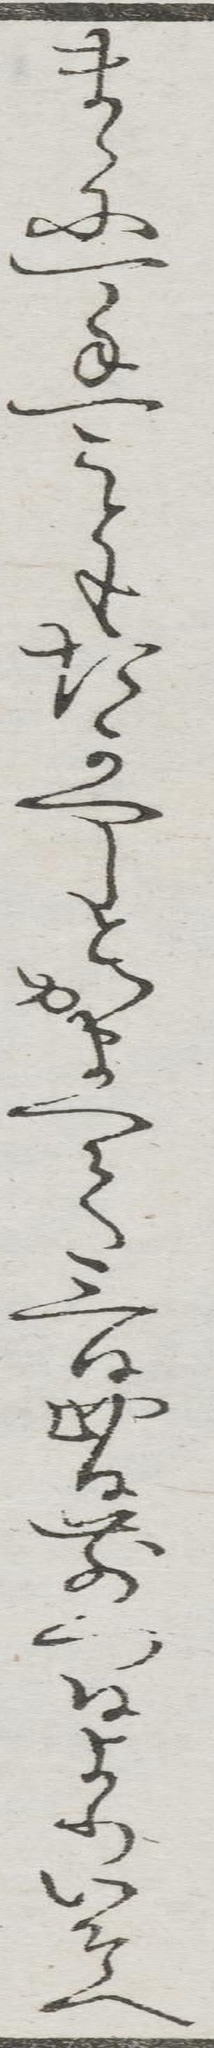まゝに一手一こともたかへしとかまへて三日四日前つ日よりいそへ
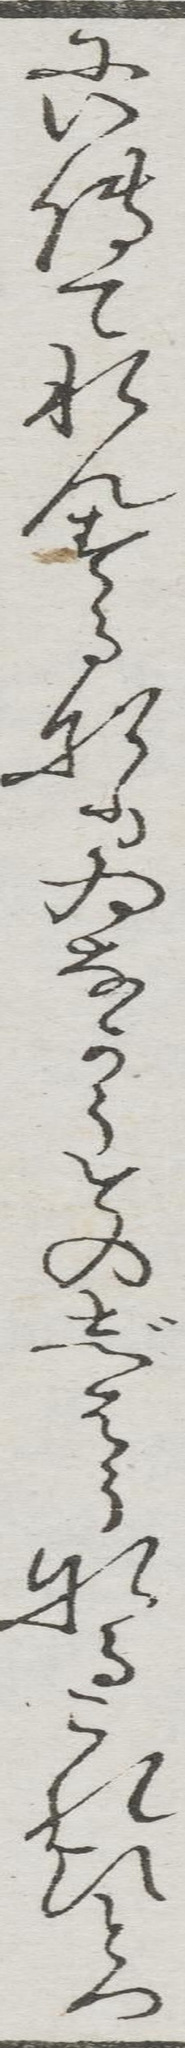にいててれんするなりゐなからとのじはうなるこれひとつ
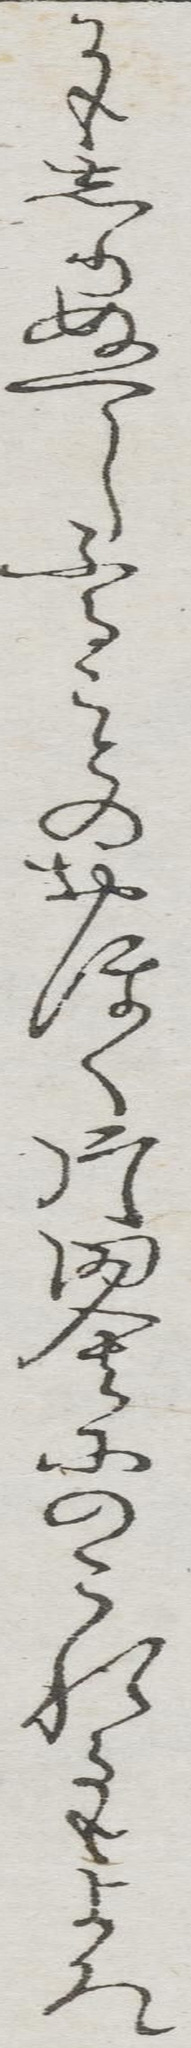にもしりぬへしふることのおほく片田舎にのこれるもよろ
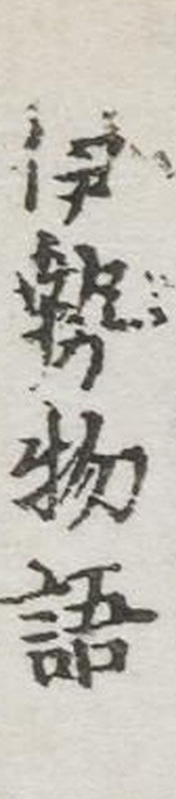伊勢物語
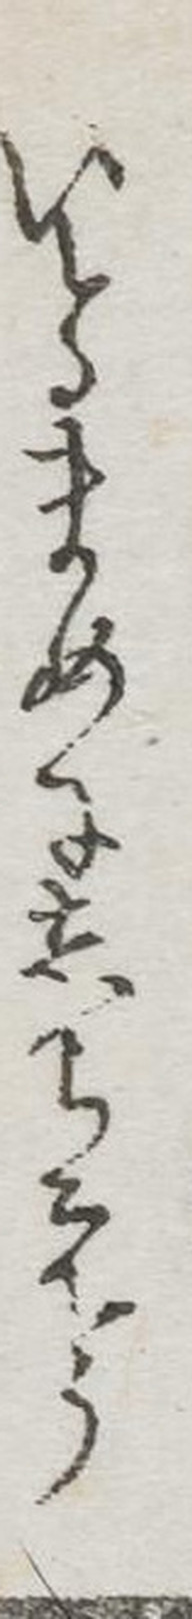いとまめにしちえう
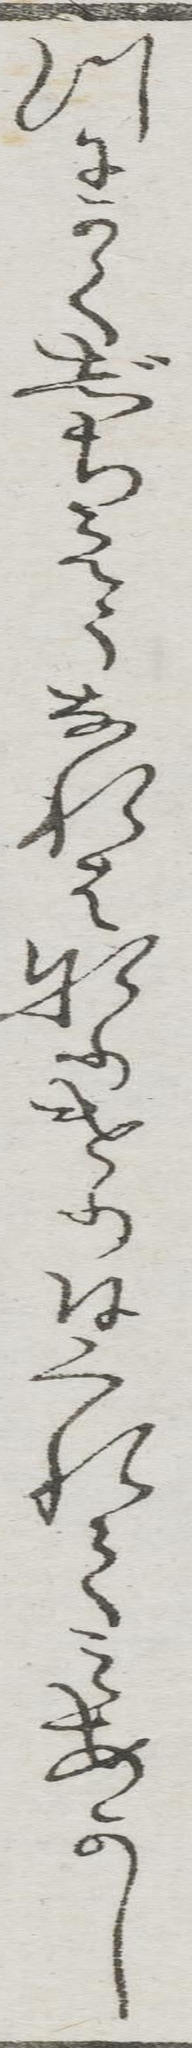つにかくじちえうなれはなりけり日くれてみあかし
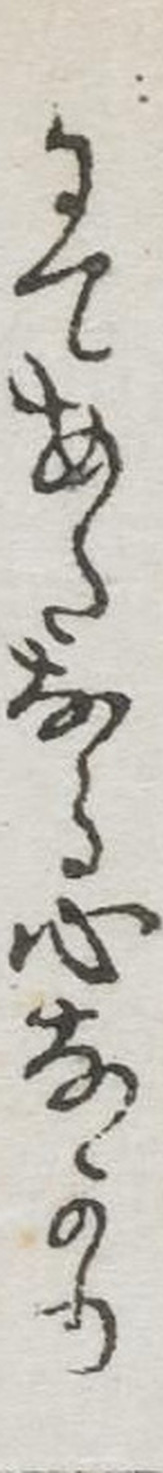にてあたなる心なかり
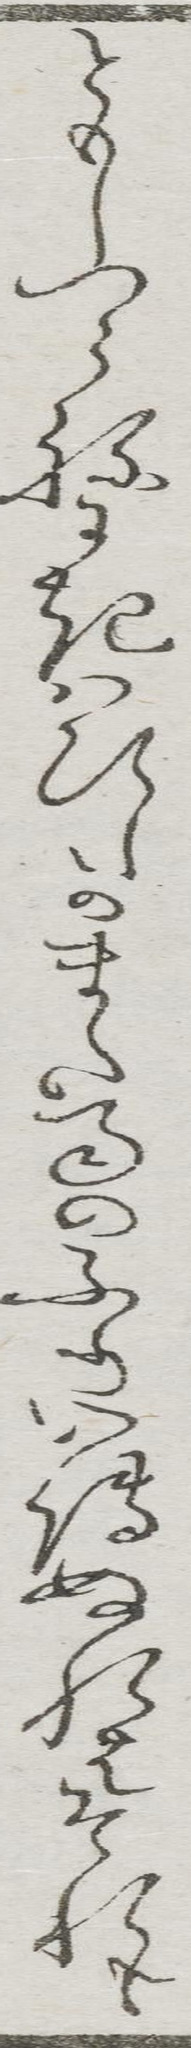ともしつらねにきはひしかまた雨のふりいてぬれはそれも
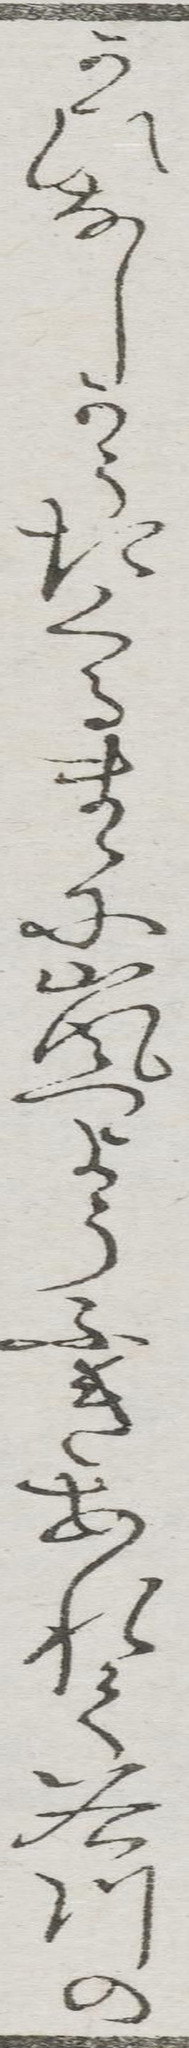かひなしかうたくるまゝに嵐つようふきあれて谷川の
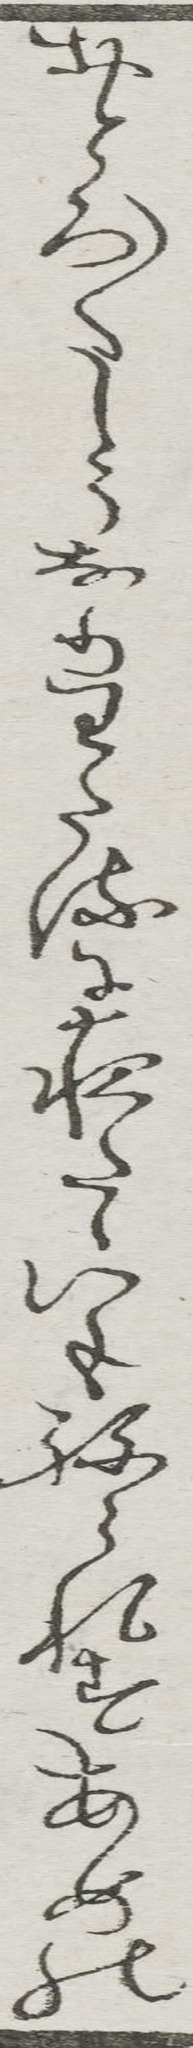おとろ〳〵しうなりわたるに夜たゝいもねられすあめの
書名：挿画熱海日記　全
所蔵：東京大学地震研究所図書室 Earthquake Research Institute Library, The University of Tokyo, JAPAN
